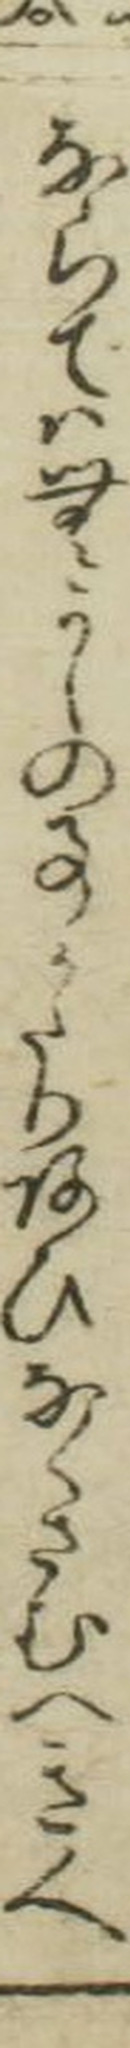ならではむかしの事かたりあひなくさむへき人
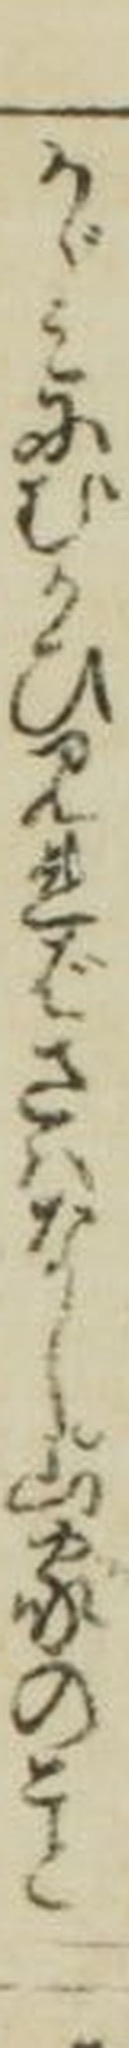かゞみにむかひ見ればさはなし。山家のこと
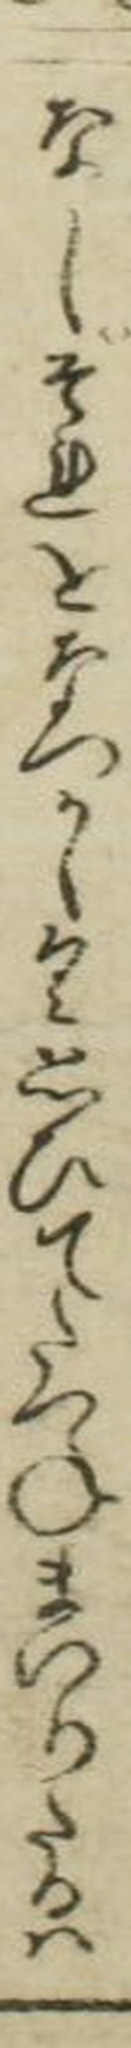なし。それをなつかしく思ひてたつねまいりたるは
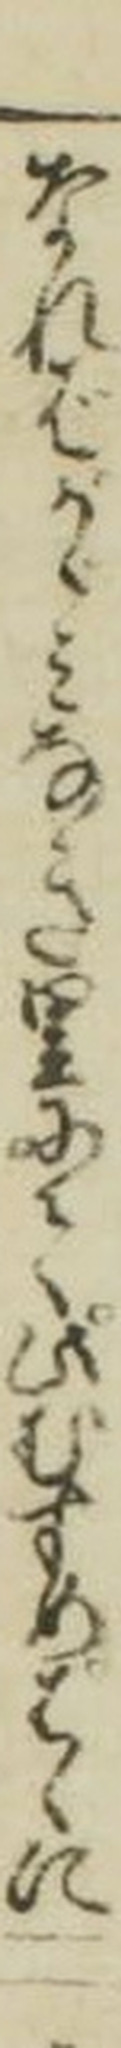なれば。かゞみなき里にて。此むすめ。はゝに
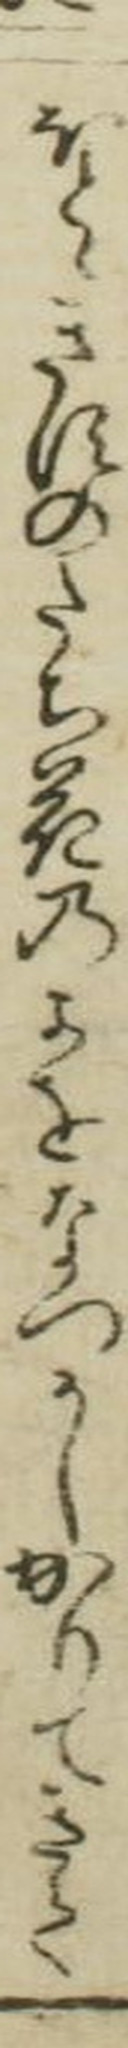ほとゝきすのたち花のかをなつかしかりてきて
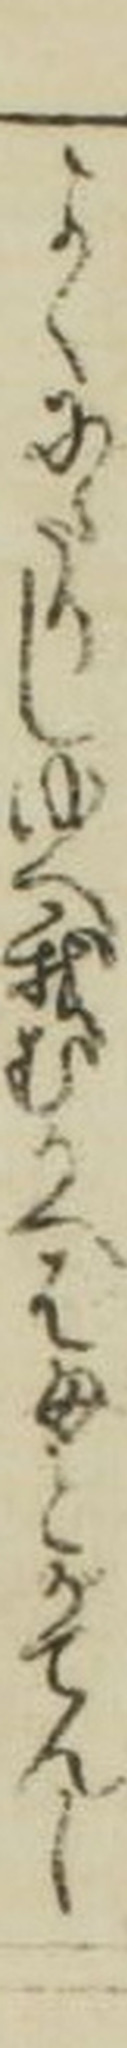よくにたりしゆへ我むかへは母とがてんし
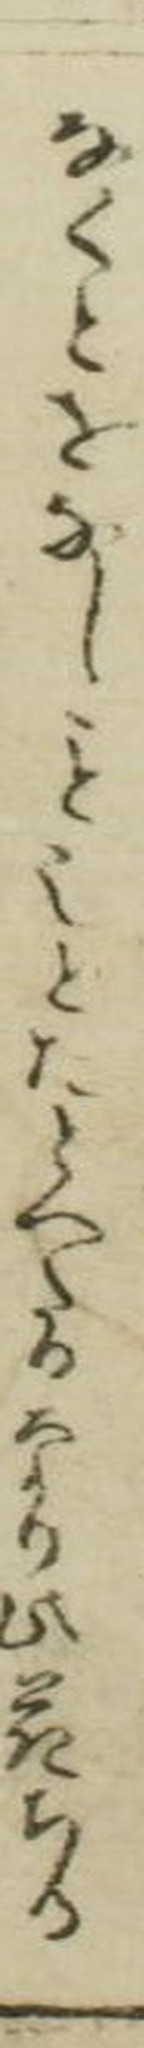なくとをなしこと也とたとへたるなり此花ちる
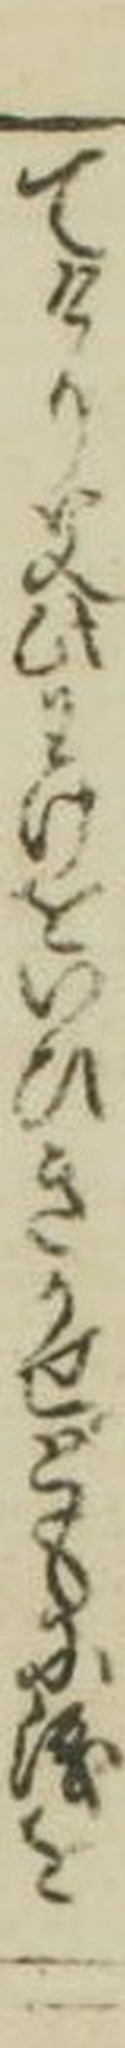てけり父此わけをいひきかせ。ともに涙を
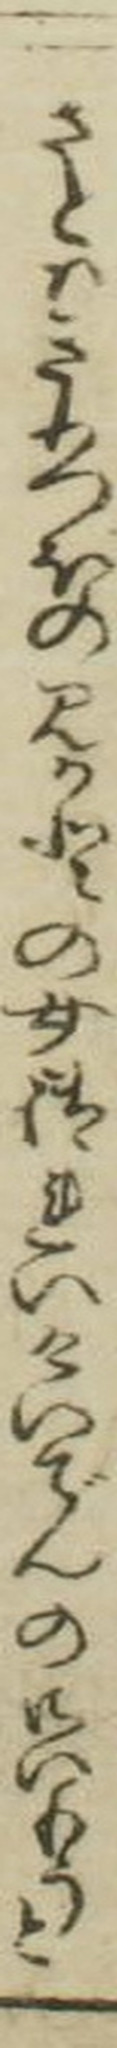さとはきりつほのみかとの女御れいけいでんの御いもうと
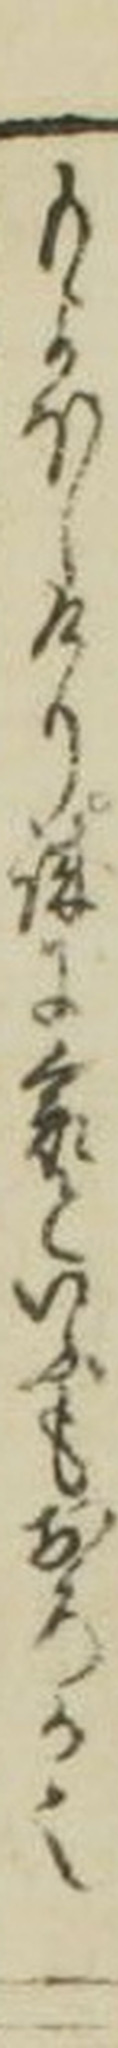もよほしけり。誠に哀といふもおろか也
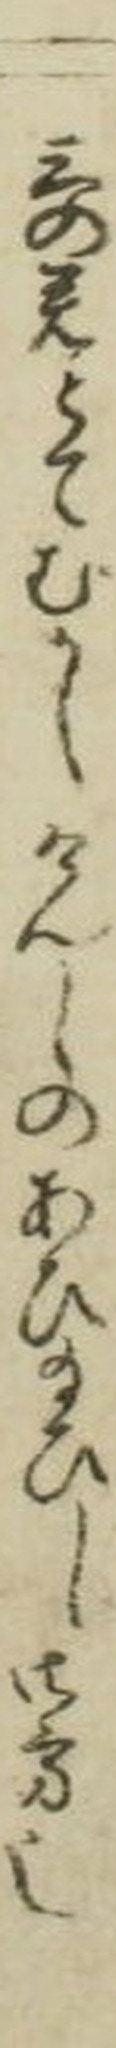三の君とてむかしけんしのあひ給ひし御方也
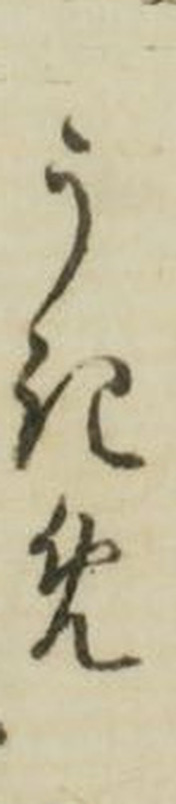うきめ
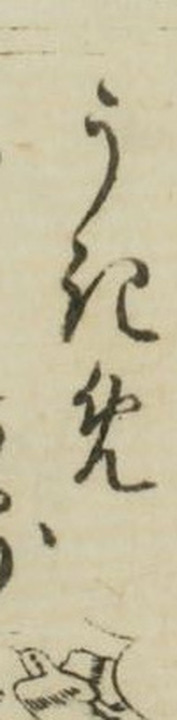うきめ
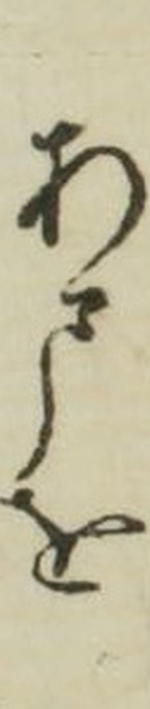あまを
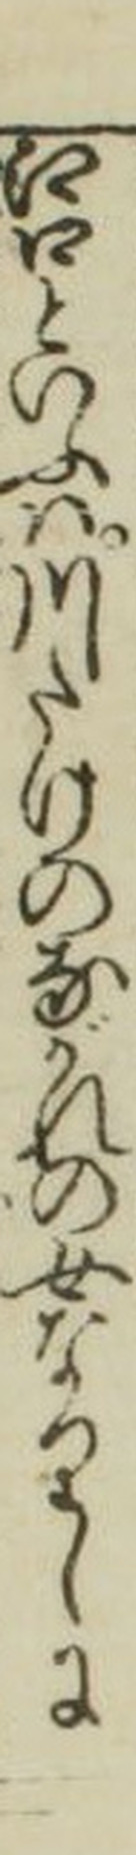江口といふは。川たけのながれの女なりしに
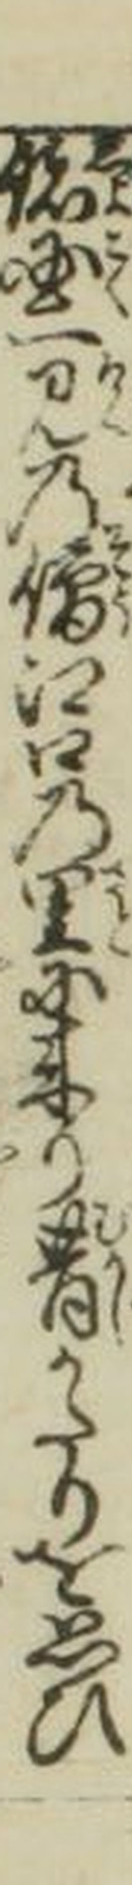諸国一見の僧江口の里に来り昔かたりを思ひ
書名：女源氏教訓鑑
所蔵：東京学芸大学附属図書館
